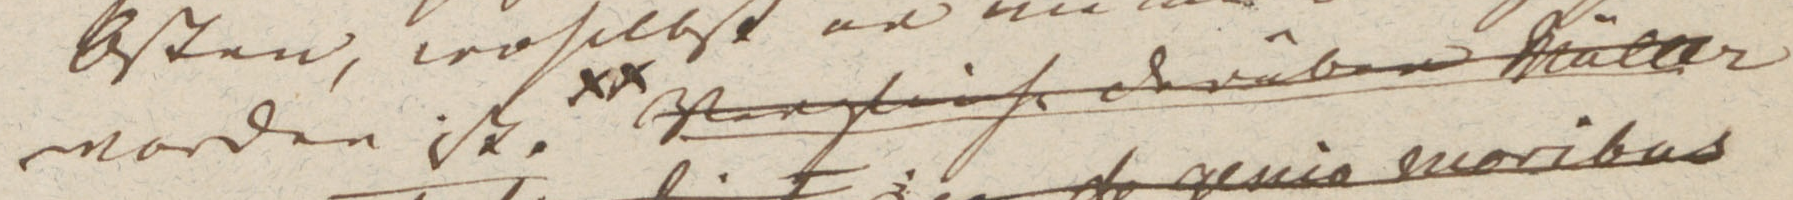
worden ist. % Vergleiche darüber Müller
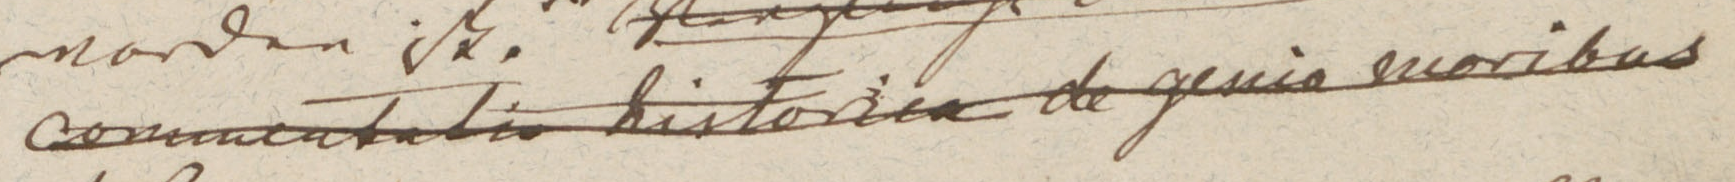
commentatio historica de genio moribus
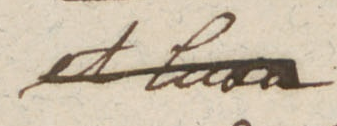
aevi Theodosiani
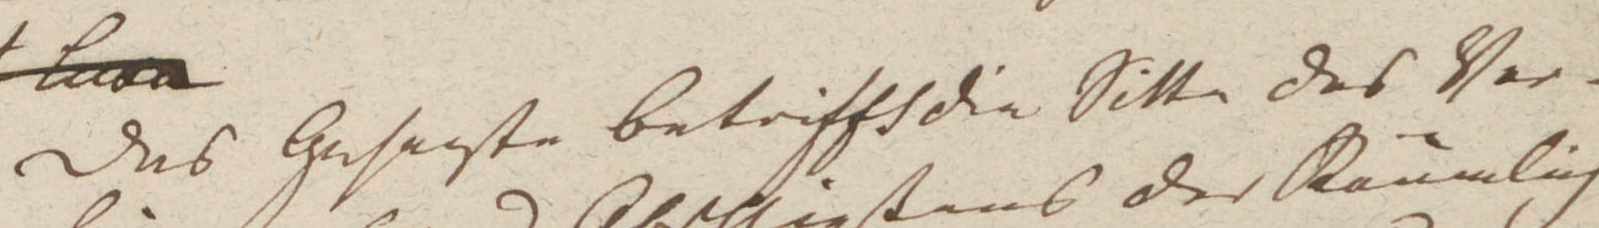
Das Gesagte betrifft die Sitte des Ver-
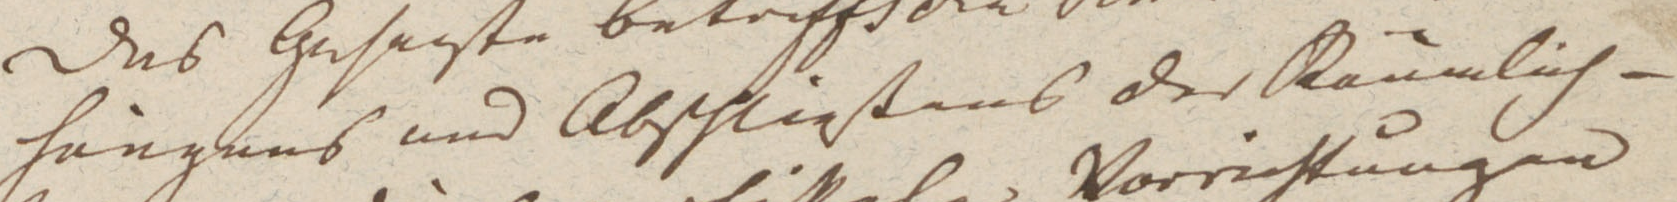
hängens und Abschliessens der Räumlich-
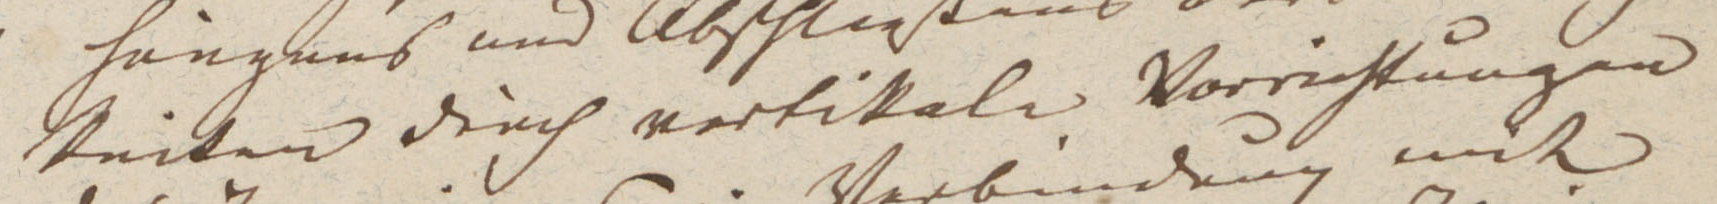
keiten durch vertikale Vorrichtungen
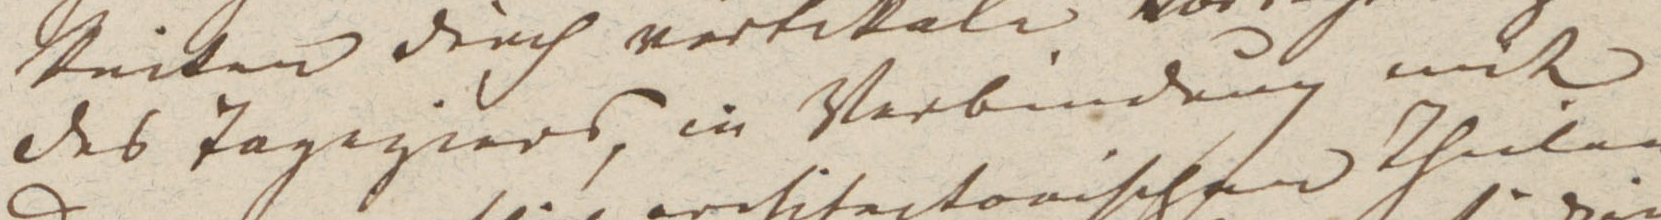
des Tapeziers, in Verbindung mit
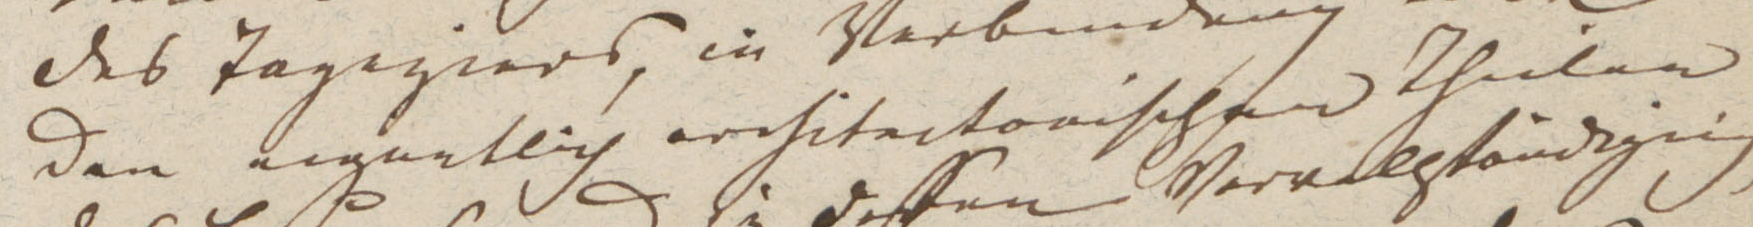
den eigentlich architectonischen Theilen
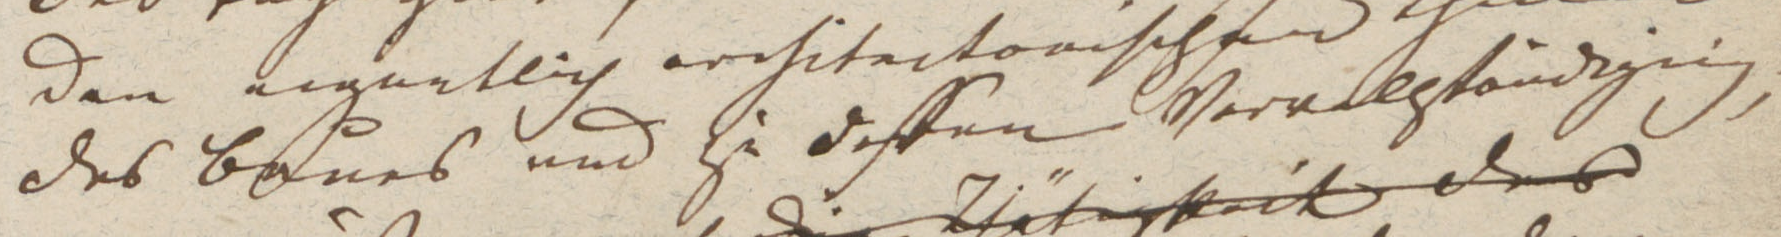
des Baues und zu dessen Vervollständigung;
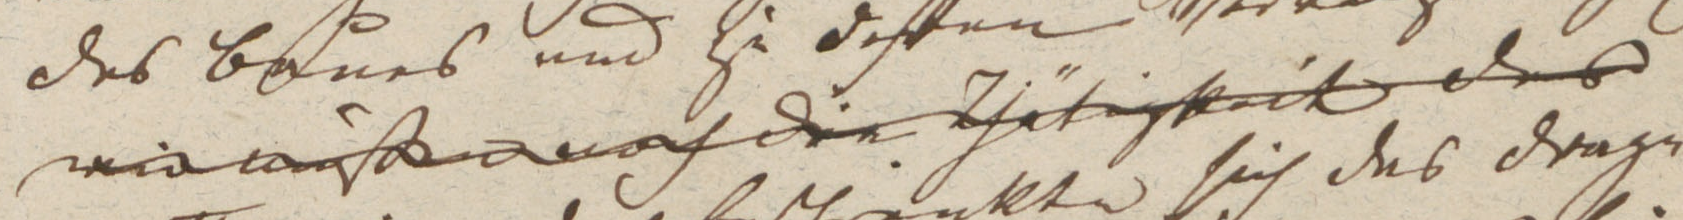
wir müssen noch die Thätigkeit des
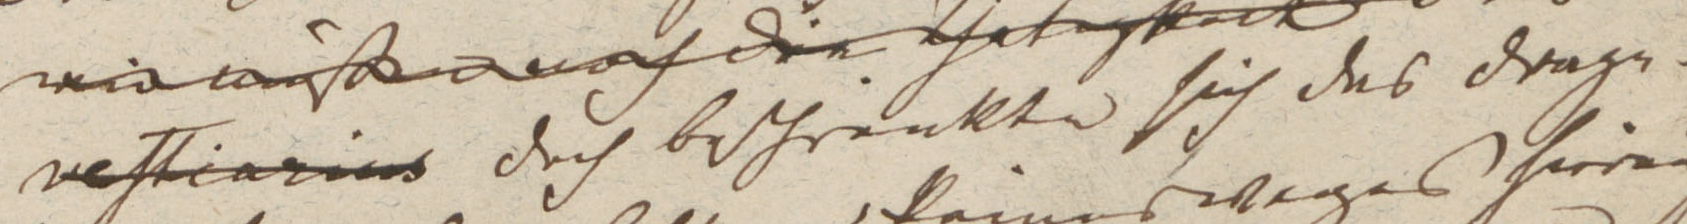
vestiarius doch beschränkte sich das Drape-
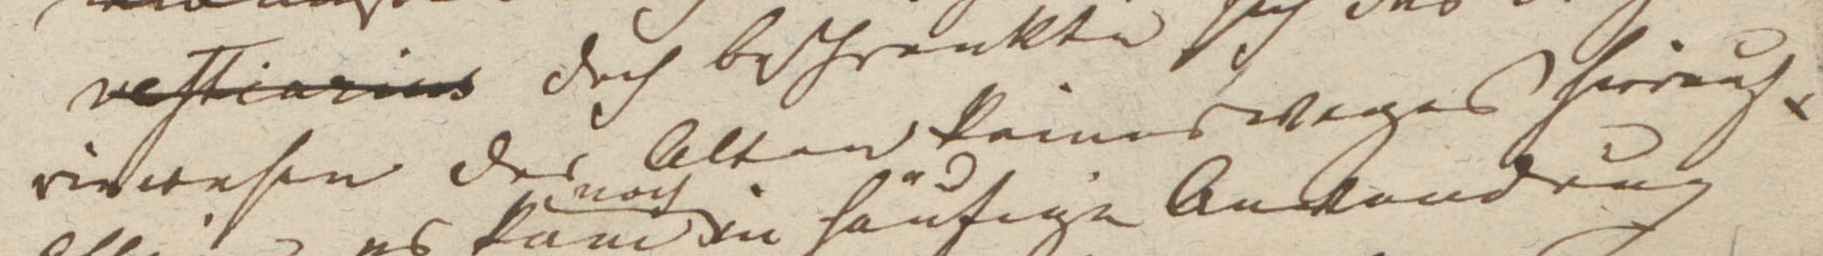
riewesen der Alten keinesweses hierauf,
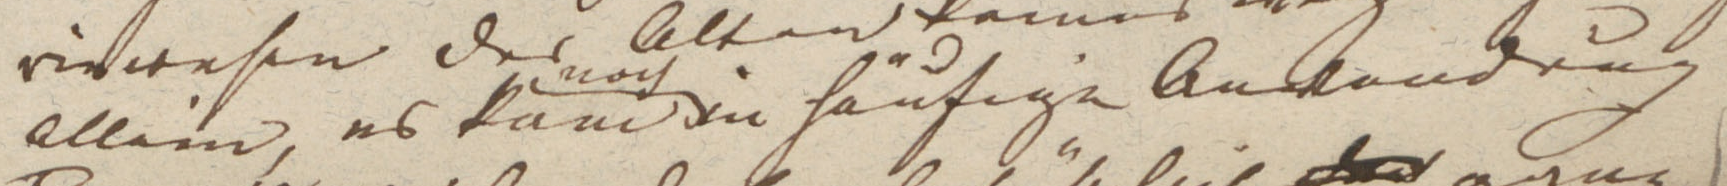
allein, es kam noch in häufige Anwendung
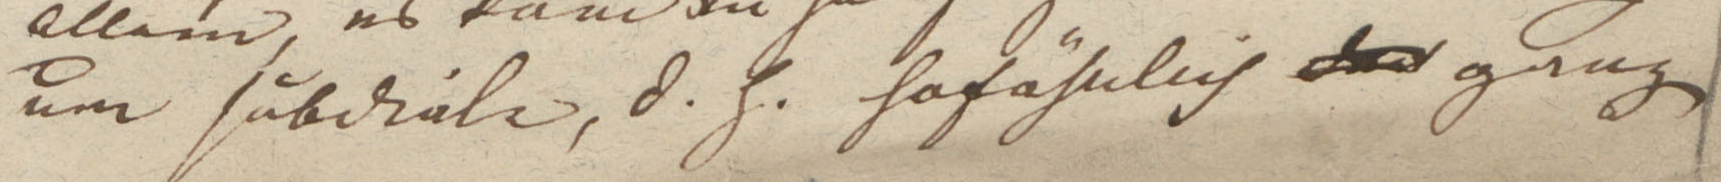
um subdiale, d.h. hofähnlich d ganz
